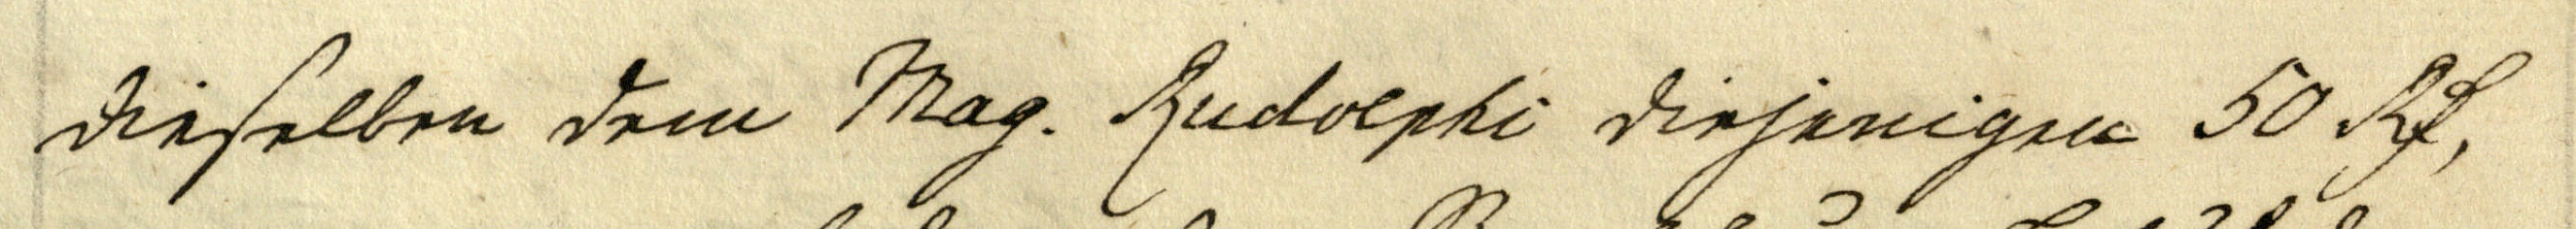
dieselben den Mag . Rector petri diejenigen des Sich
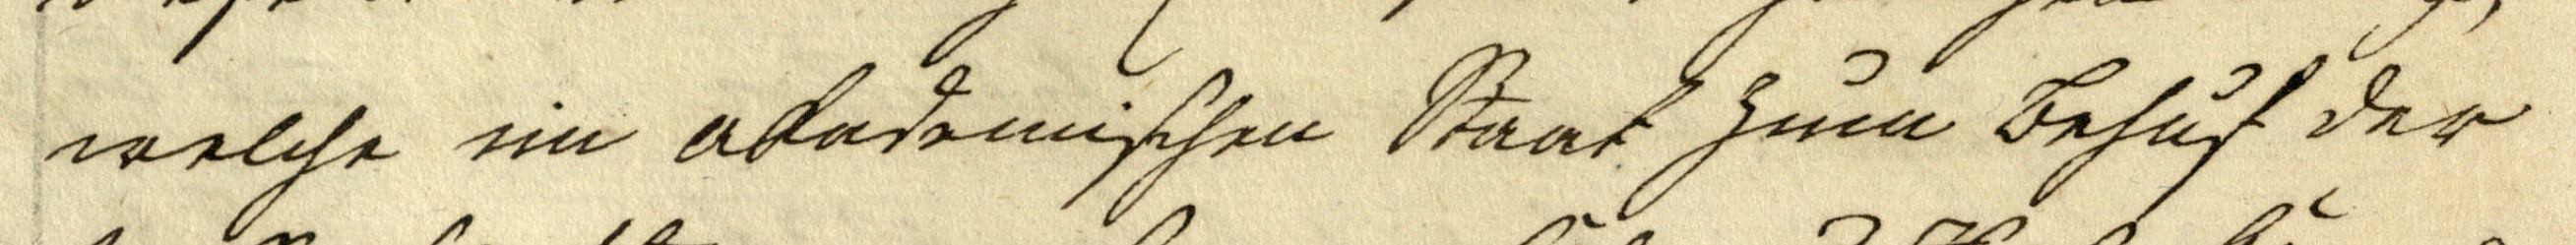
welche ein akademischen Staat zum Behuf der
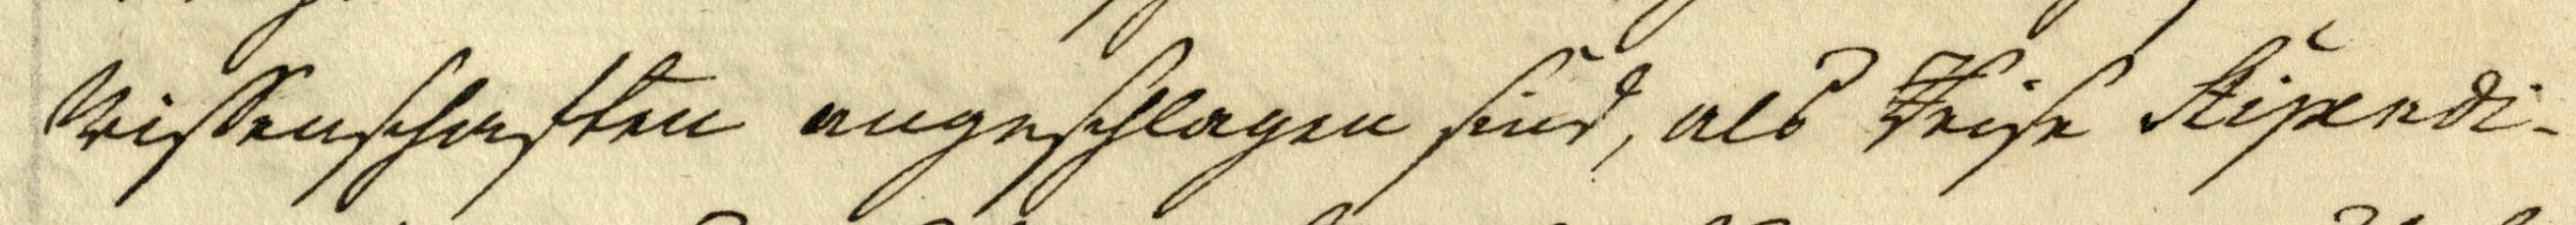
Wissenschaften angeschlagen sind , als Reis Stipendii
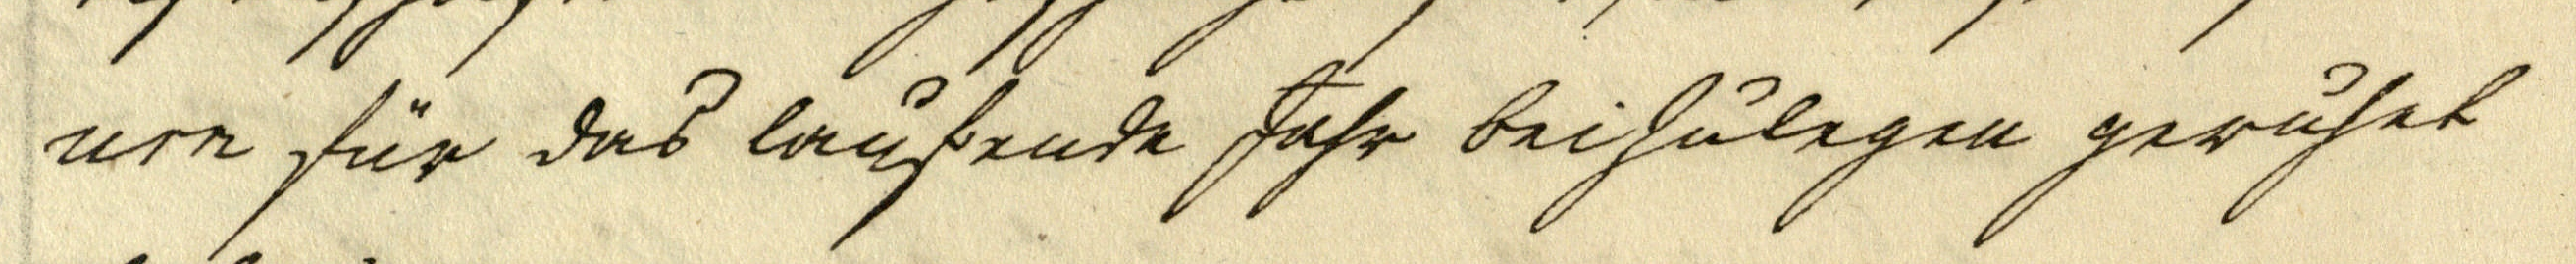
mie für das laufende Iahr beizutragen geruhet
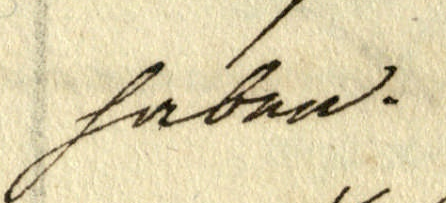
meinung
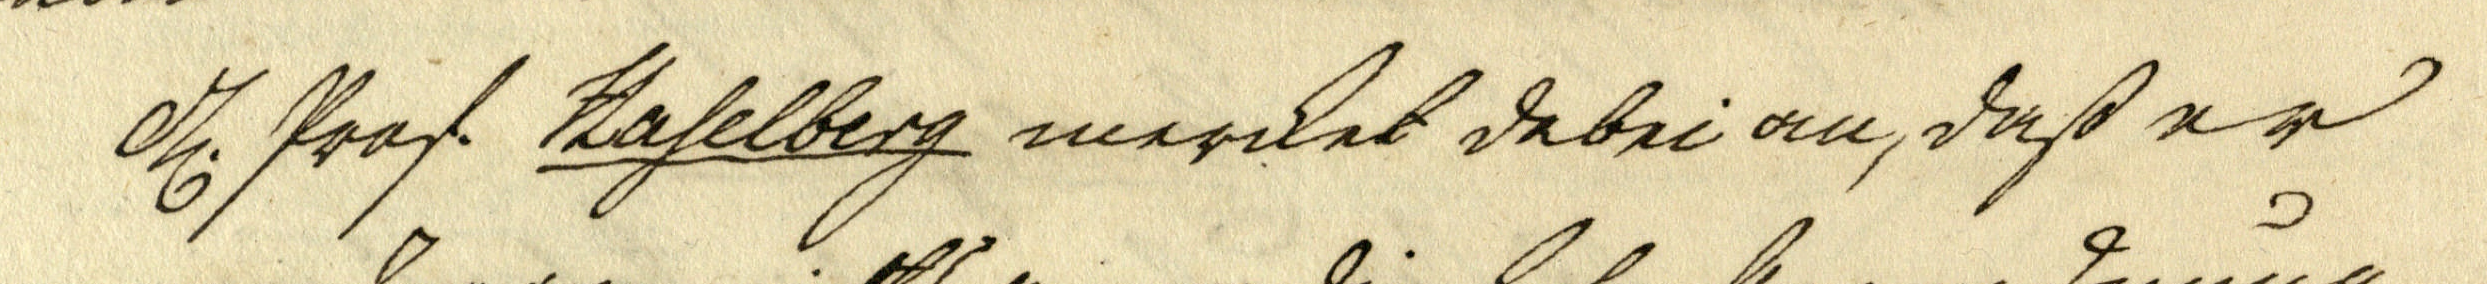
A . Prof Haselberg merket dabei an das er
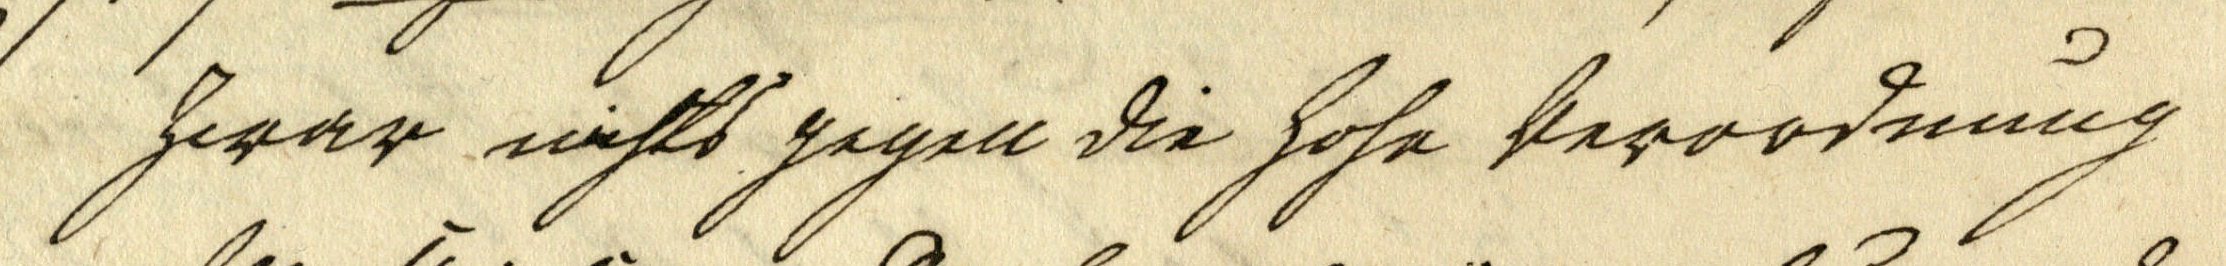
zwar nichts gegen die hohe Verordnung
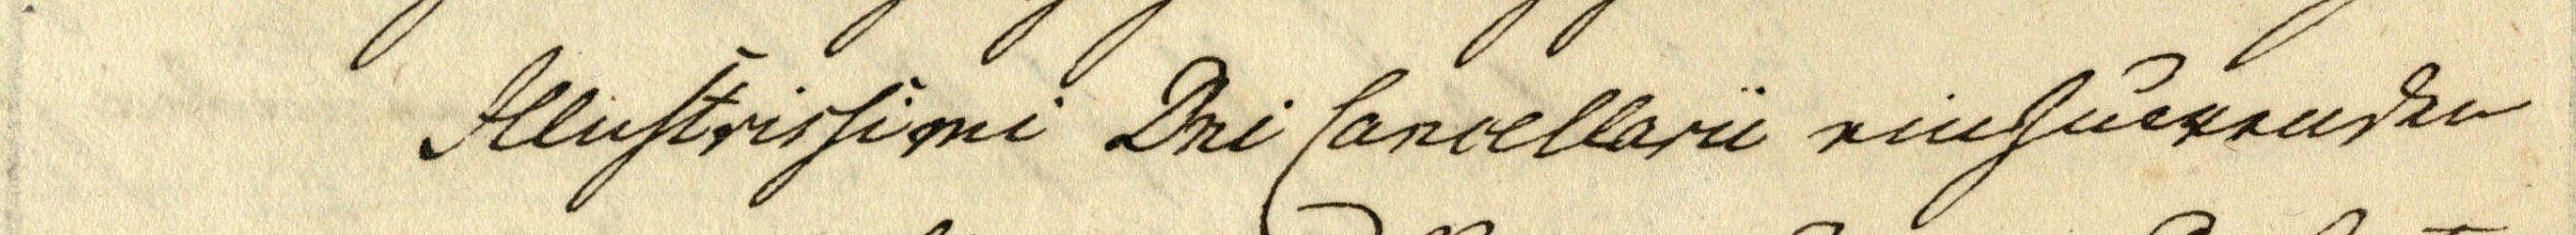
schlechter hierü Dem Cancellario einzuwenden
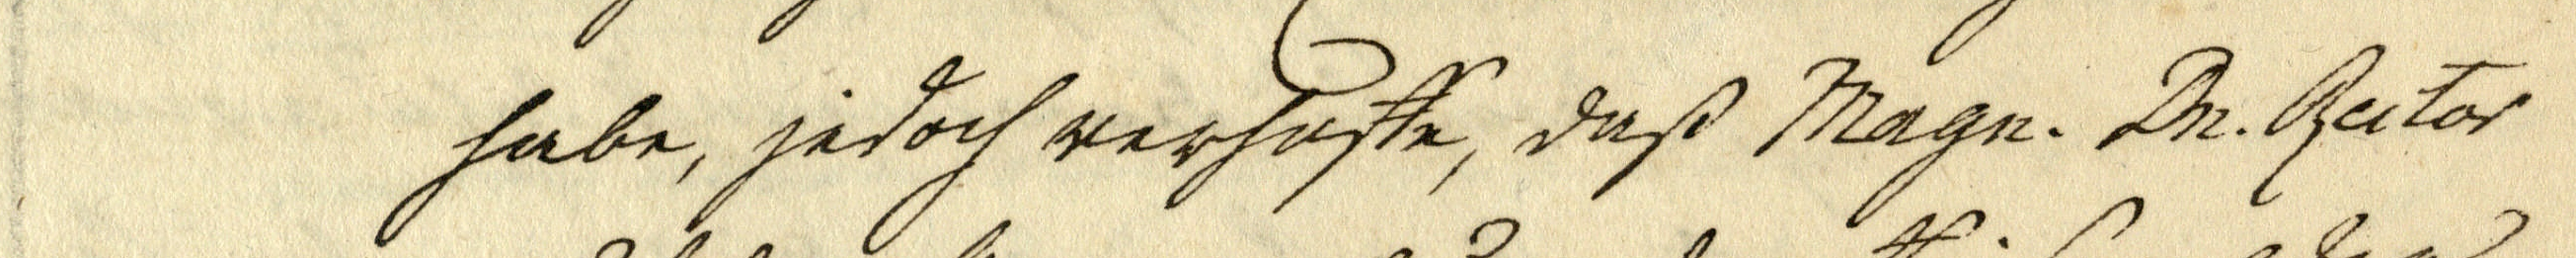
habe , jedoch verliesse , daß Magn Der Rector
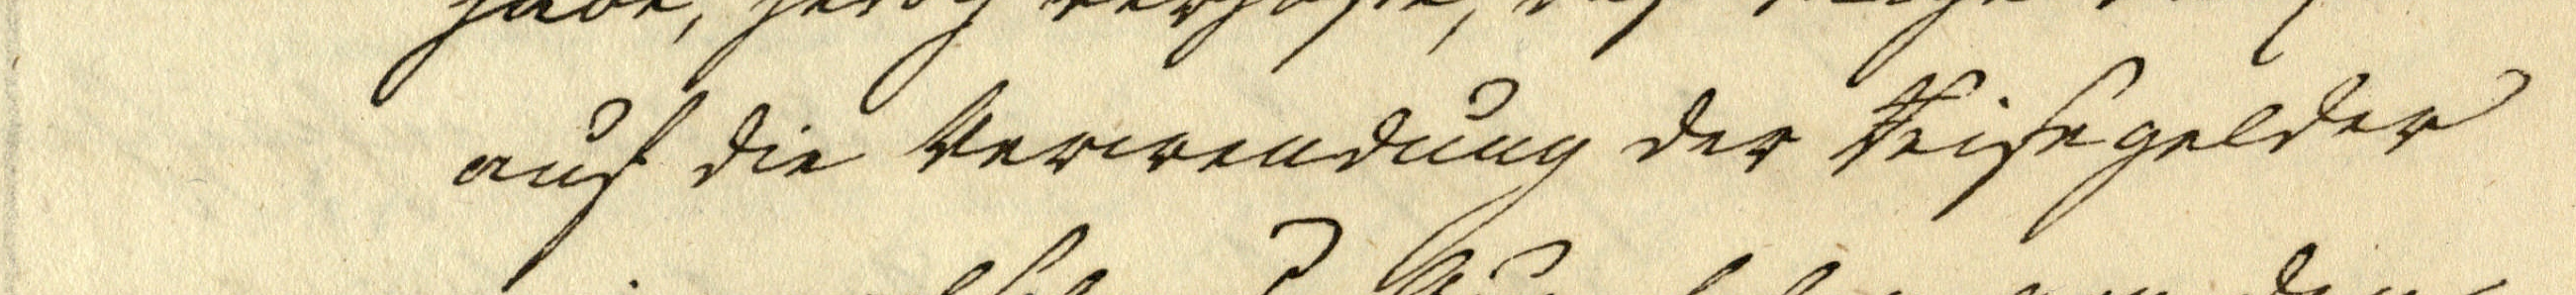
auf die Verwendung der Reis Gelder
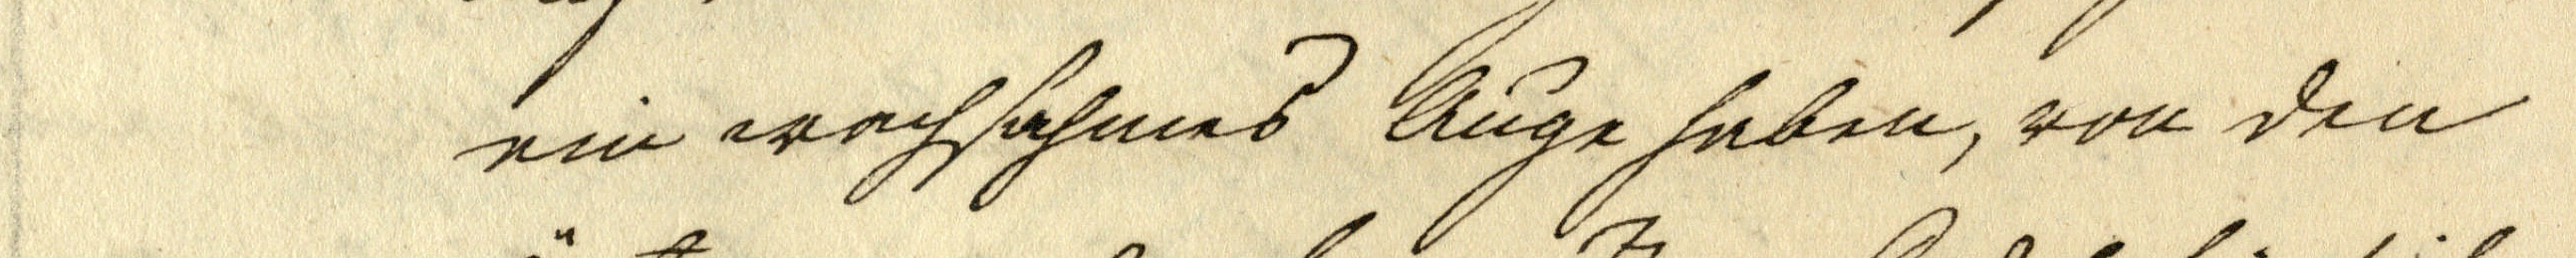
ein wachsahmes Auge haben , von dem
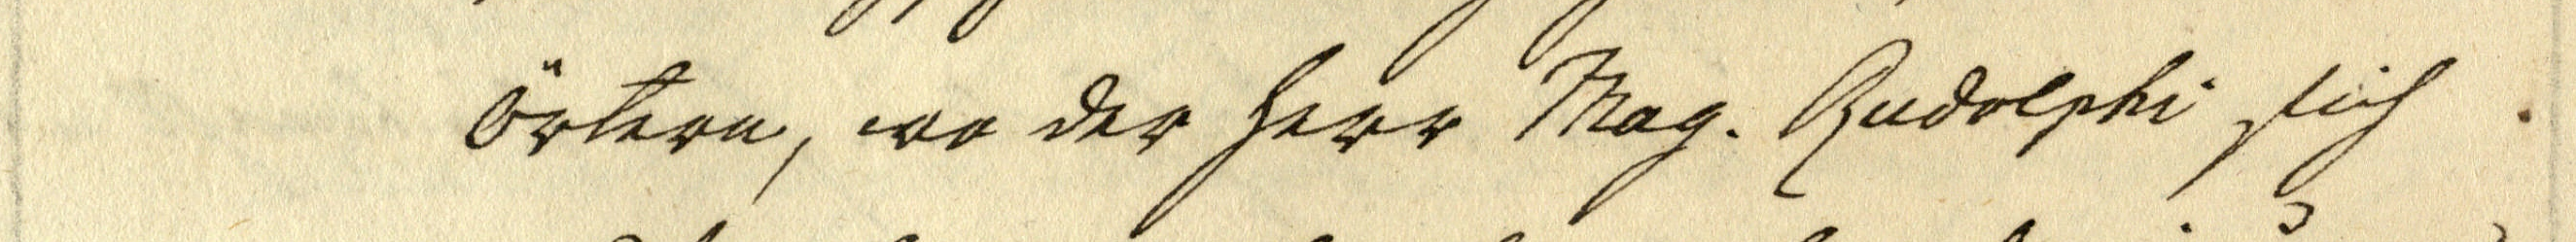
Erstern , wie der Herr Mag . Handelnde sich
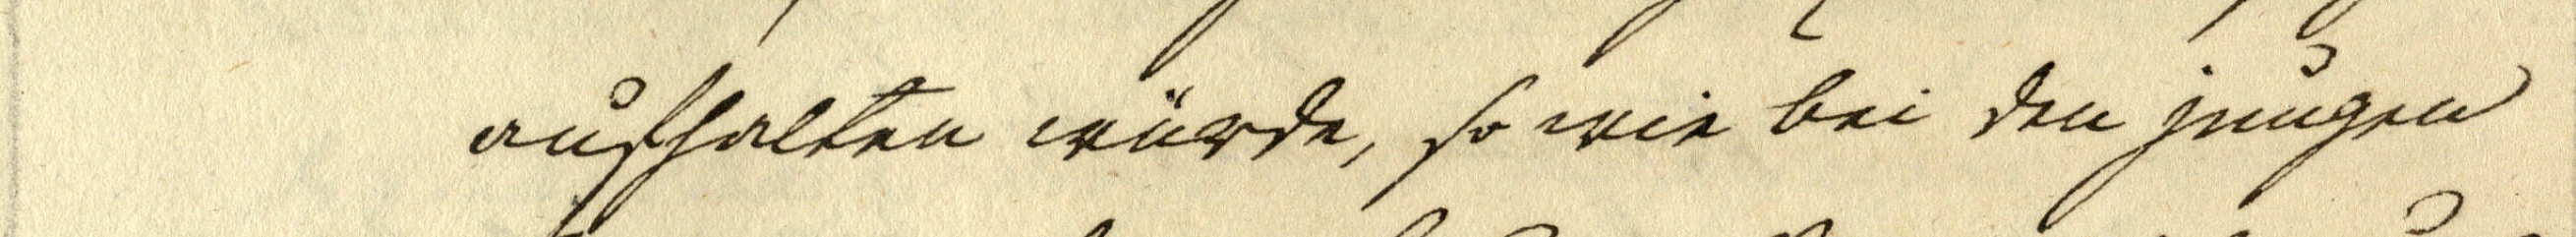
aufhalten würde , so wie bei den geringen
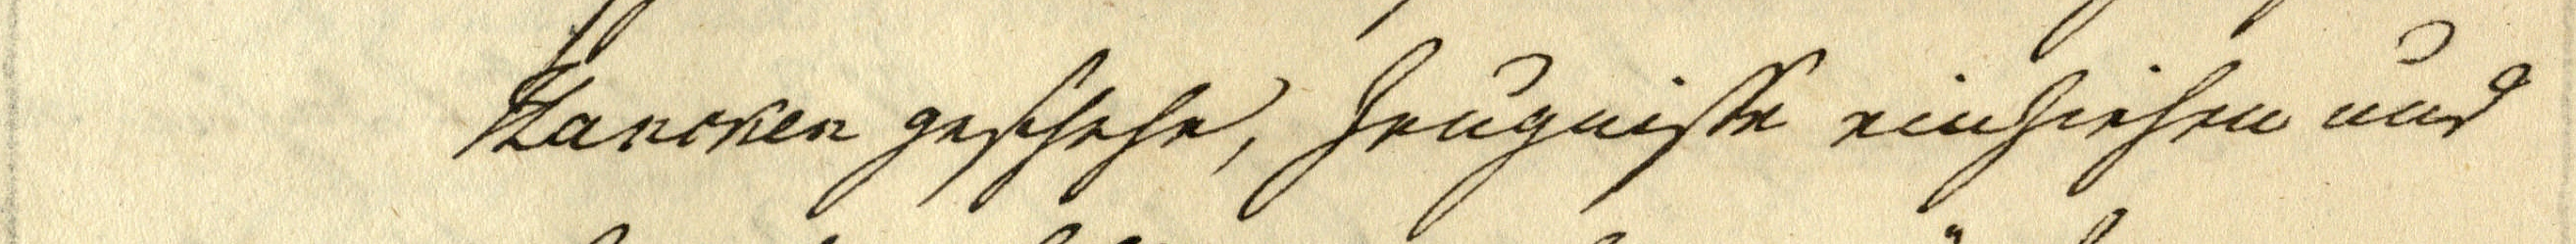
Starcken geschehe Zeugnisse einziehen und
